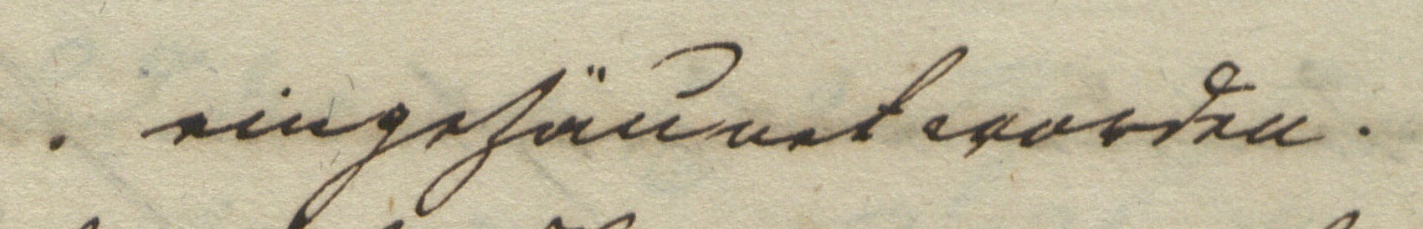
eingezäunet worden.
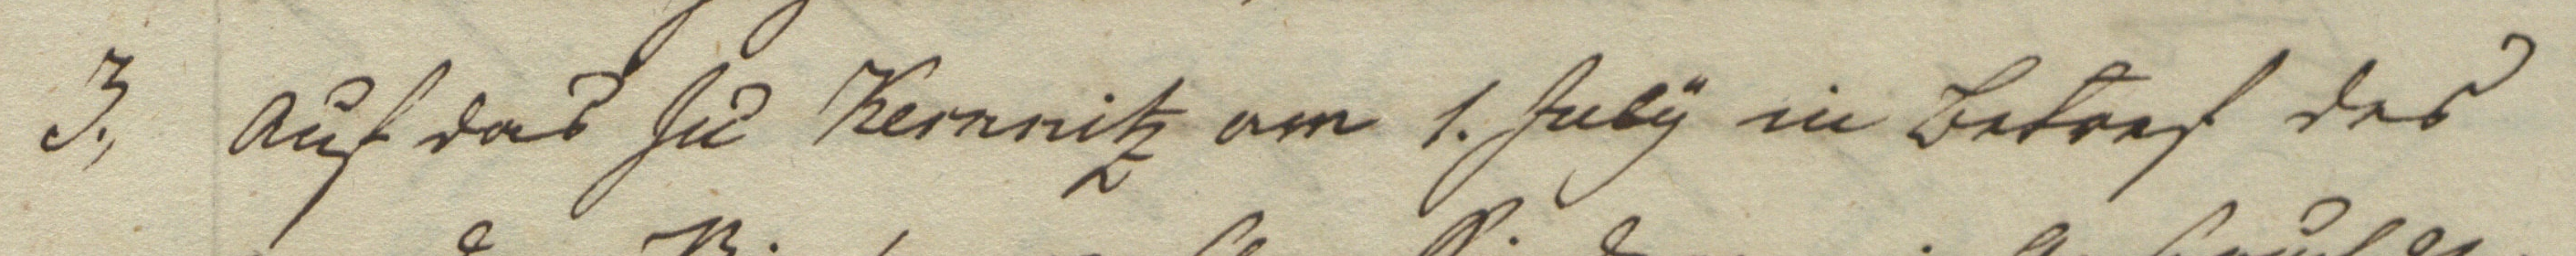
3., Auf das zu Kemnitz am 1. Julÿ in Betref des
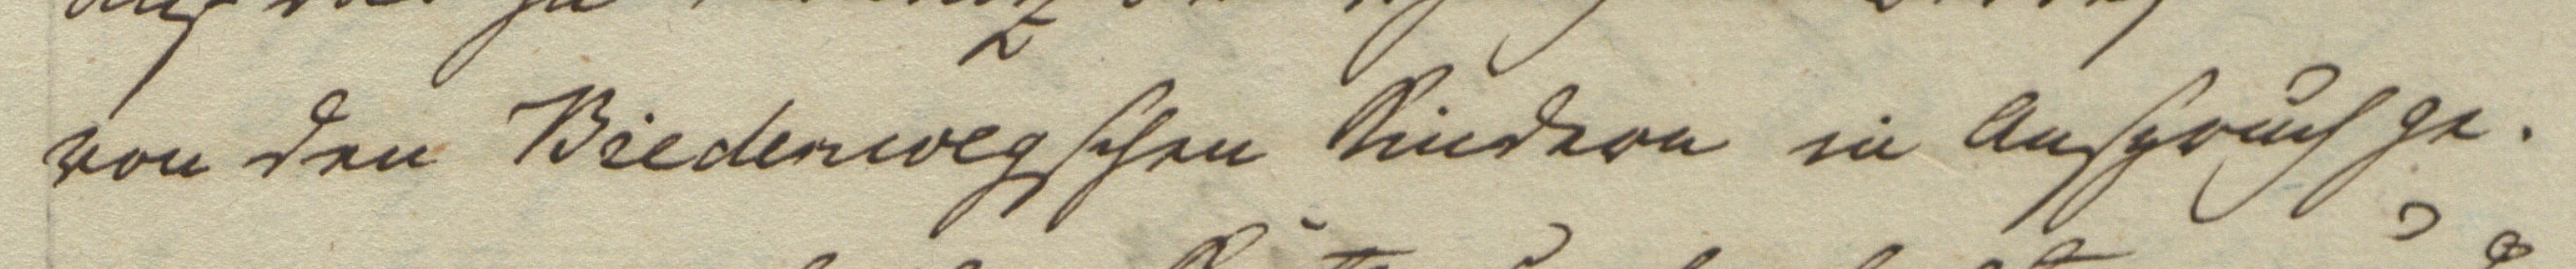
von den Biedenwegschen Kindern in Anspruch ge¬
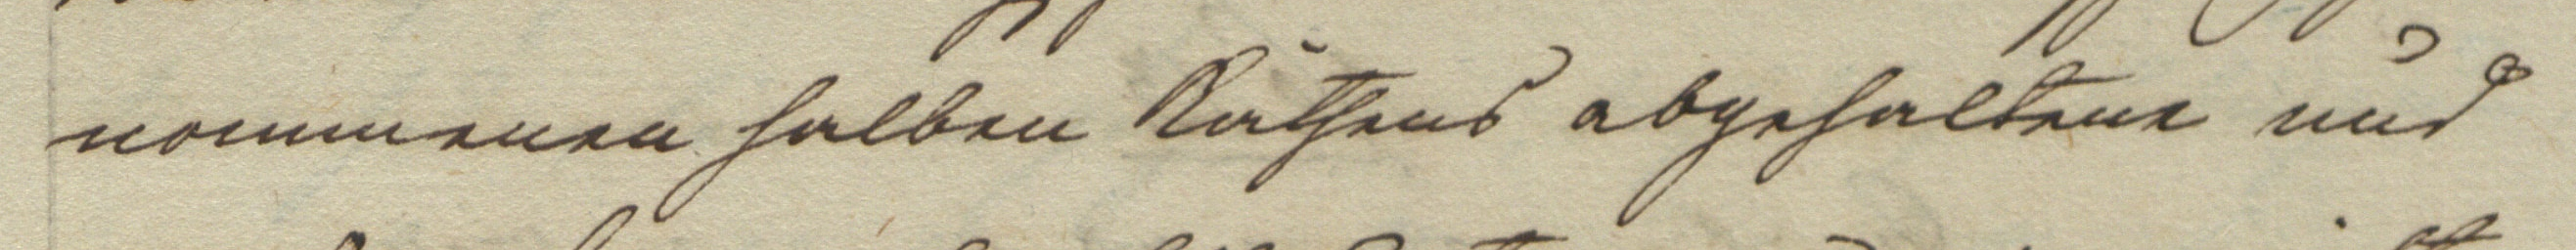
nommenen halben Kathens abgehaltene und
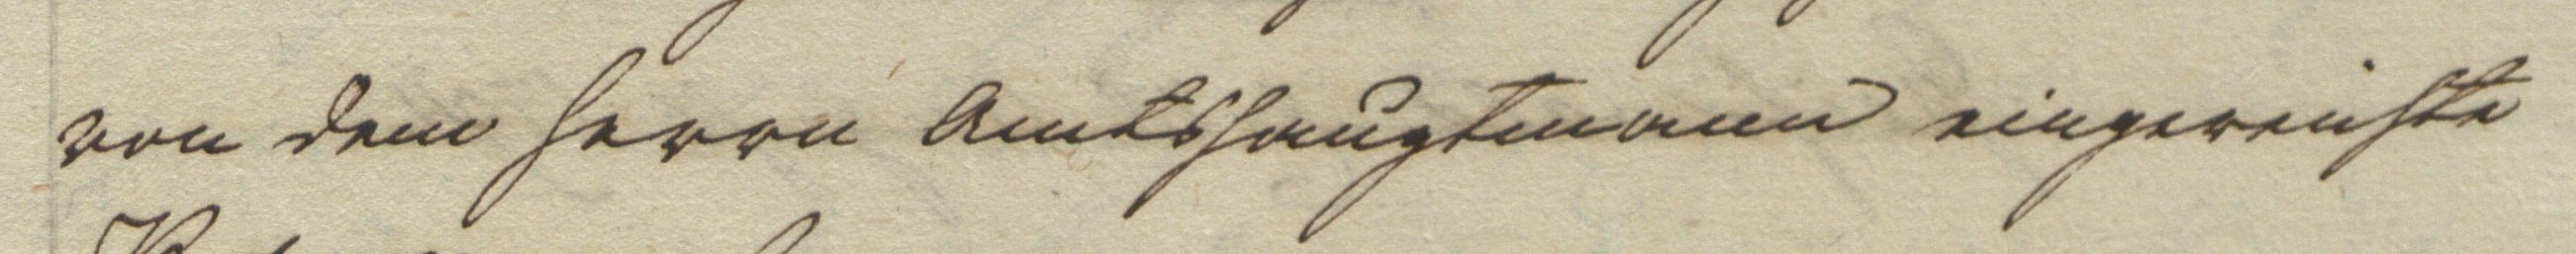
von dem Herrn Amtshauptmann eingereichte
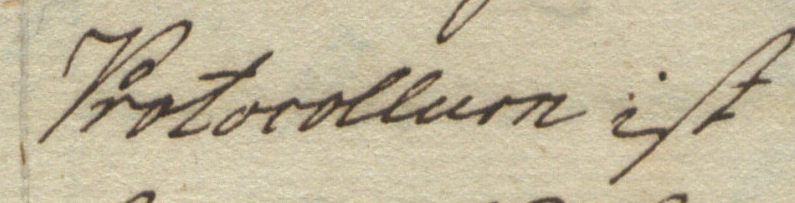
Protocollum ist
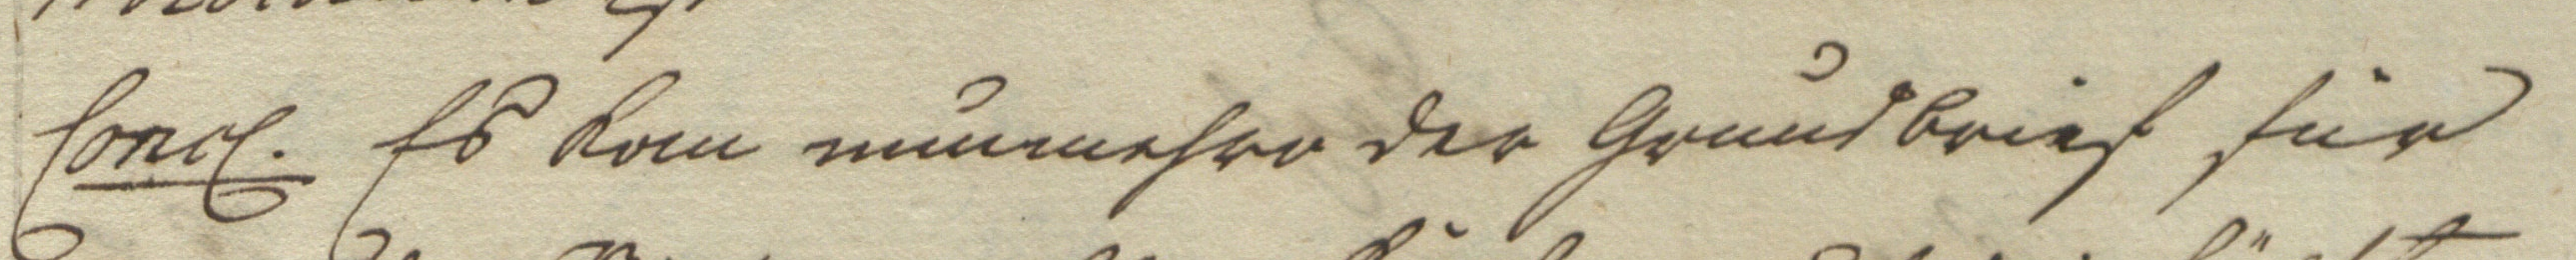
Concl. Es kan nunmehro der Grundbrief für
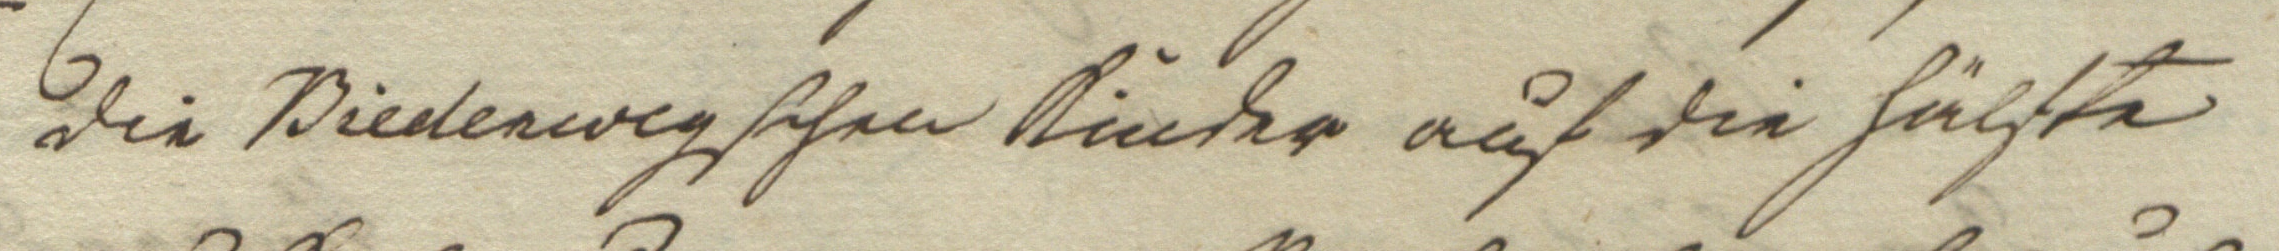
die Biedenwegschen Kinder auf die Hälfte
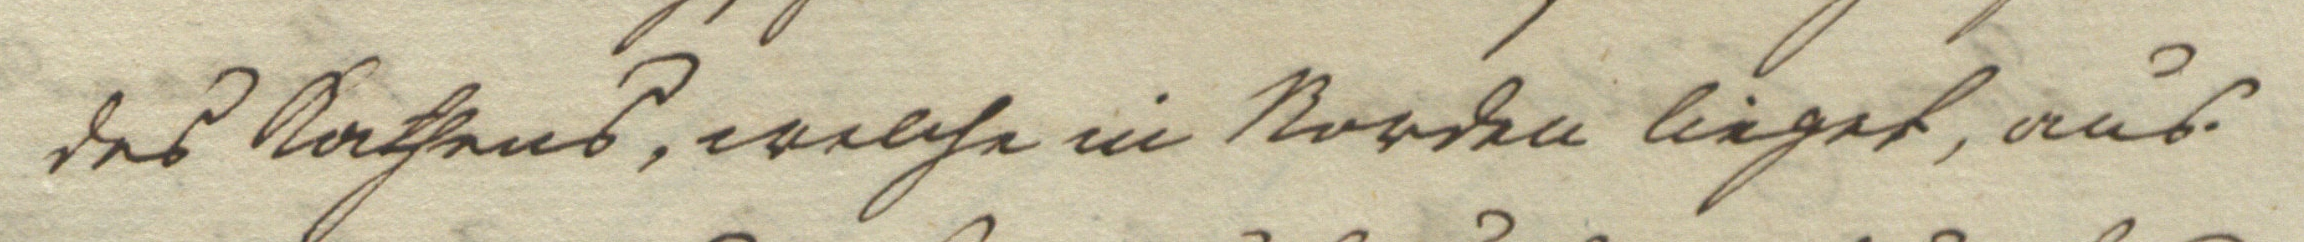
des Kathens, welche im Norden lieget, aus¬
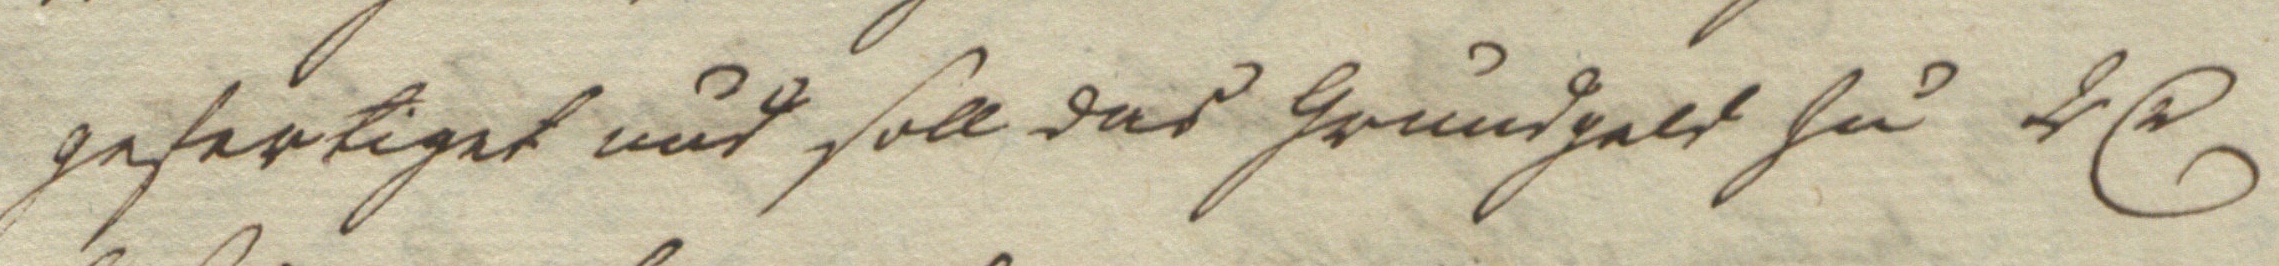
gefertiget und soll das Grundgeld zu 2 l.
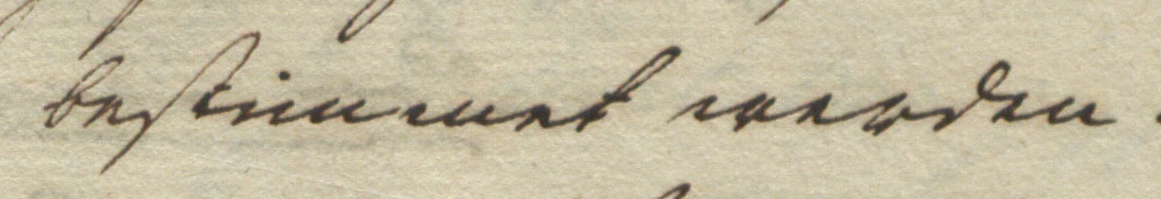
bestimmet werden.
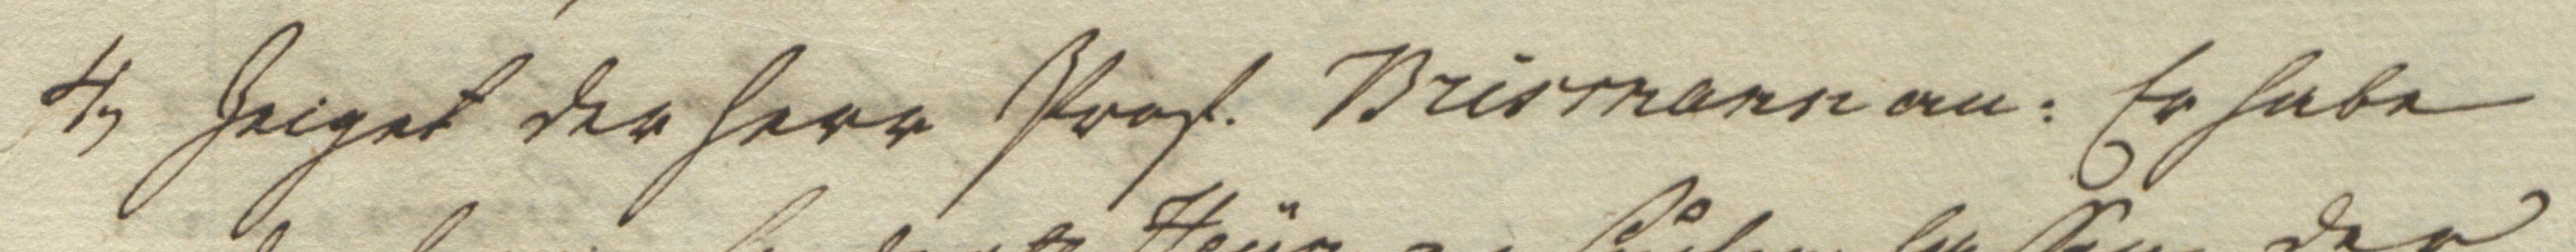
4., Zeiget der Herr Prof. Brismann an:. Er habe
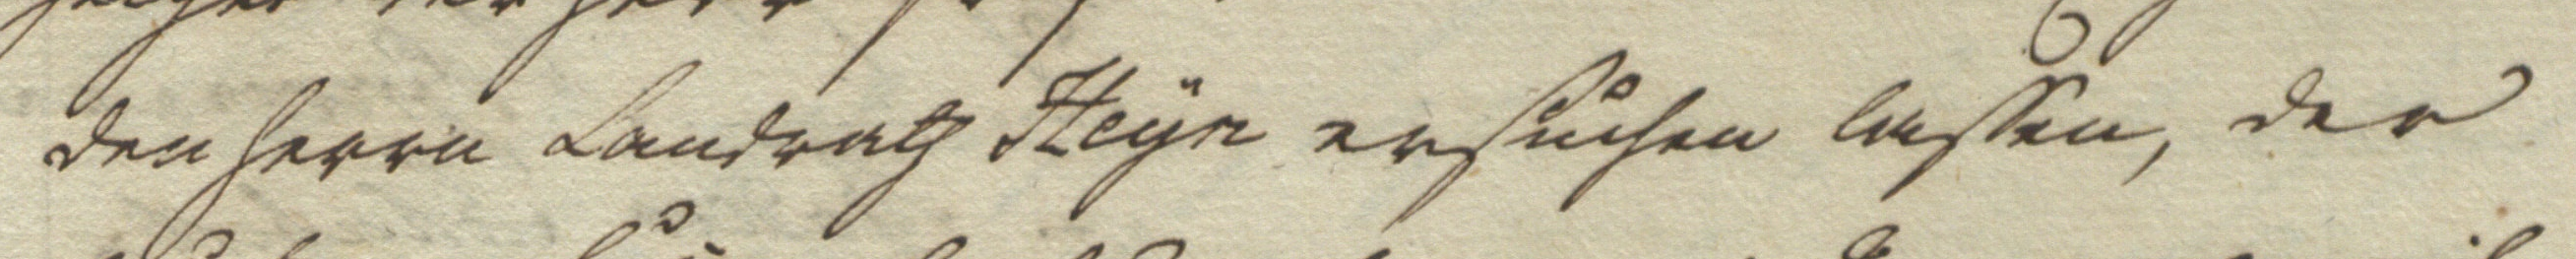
den Herrn Landrath Heÿn ersuchen lassen, der
